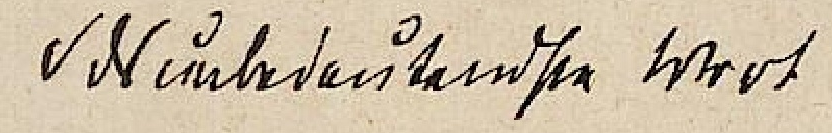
V ds unbedeutendste Wort
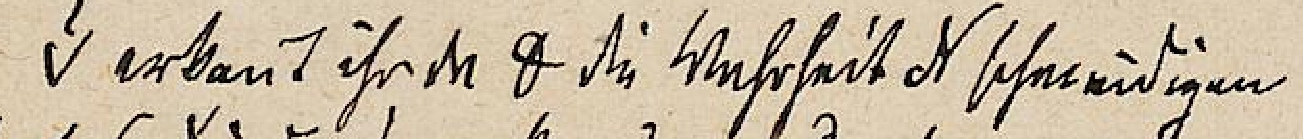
V erkent ihr da o die Wahrheit ds schneidigen
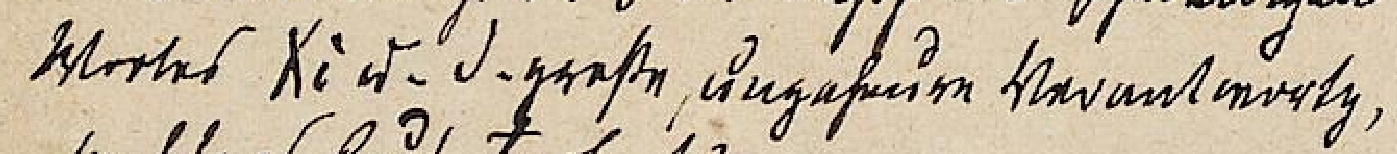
Wortes Χι u. d. große, ungeheure Verantwortg,
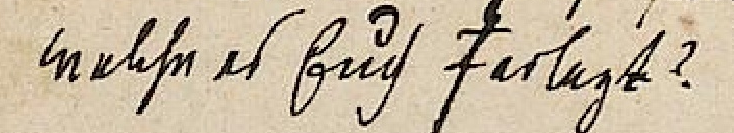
welche es Euch ferlegt?
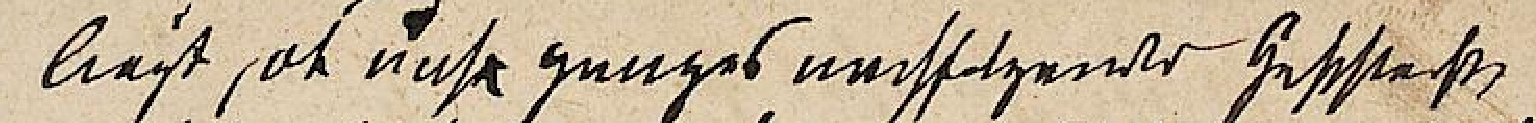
liegt, ob unsr. ganzes nachfolgende Geschlecht,
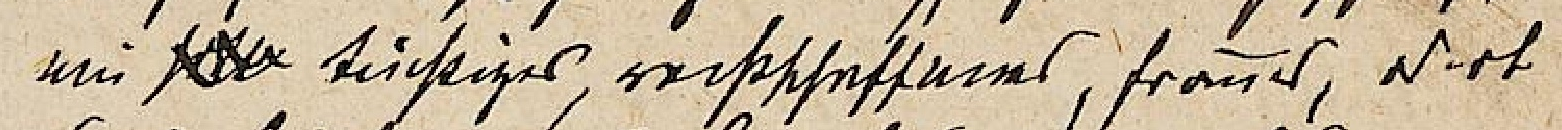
ein frtt tüchtiges, rechtschaffendes, fromes, od. ob
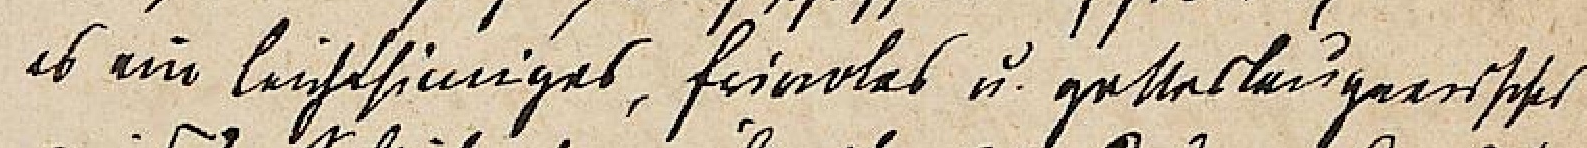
es ein leichtsinniges, frivoles u. gotterleugnerisches
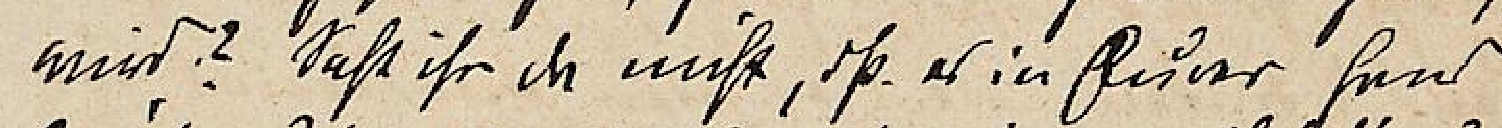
wird? Seht ihr da nicht, dß es in Eurer Hand
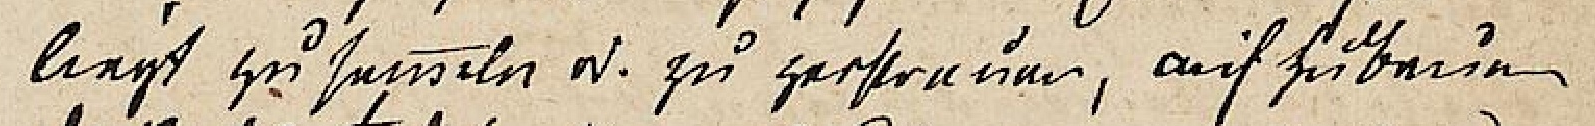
liegt zu sameln od. zu zerstreuen, auzubauen
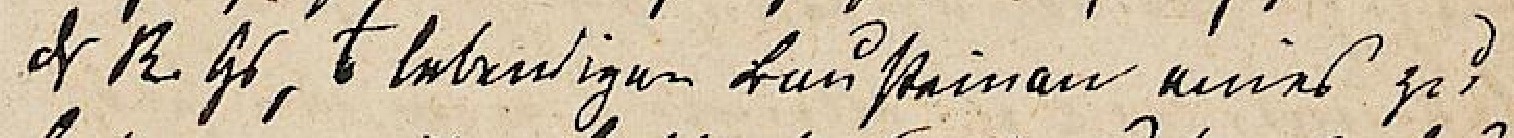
ds R Gs. s lebendigen Bausteinen eines zu
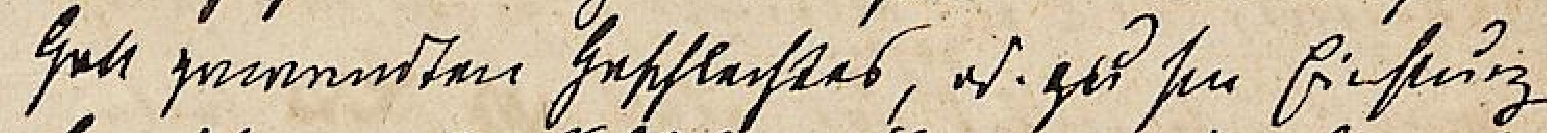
Gott gewandten Geschlechtes, od. zu sm Einsturz
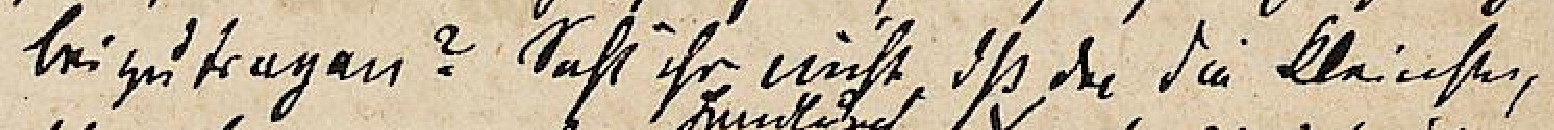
beizutragen? Seht ihr nicht, dß da die kleinste,
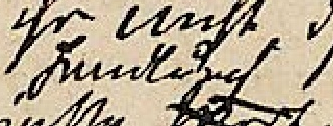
Handlung
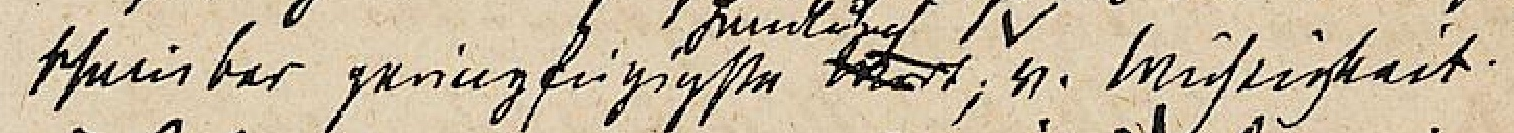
scheinbar geringfügigste Wort, v. Wichtigkeit
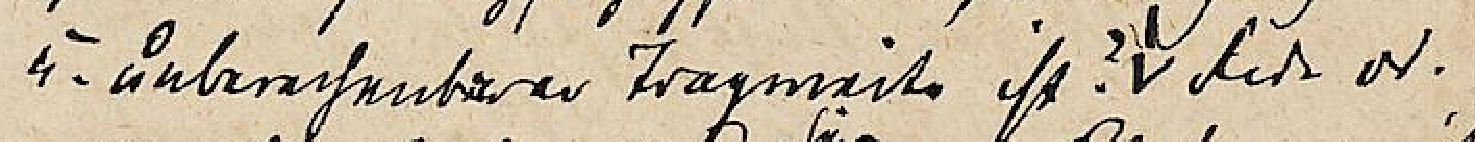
u. unberechenbarer Tragweite ist? V Für od.
